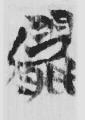{羽能}
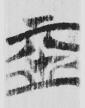亞
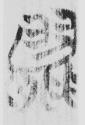{羽能}
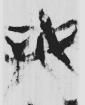好
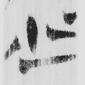少
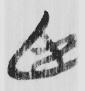臣
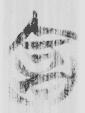合
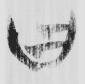曰
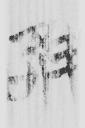唯
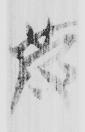皮
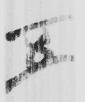五
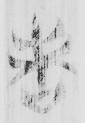味
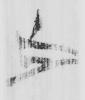之
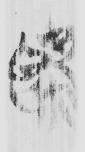{既火}
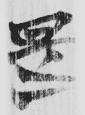是
